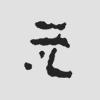亓（其）
